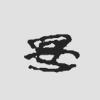是
